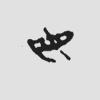母
